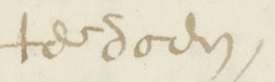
te doen.
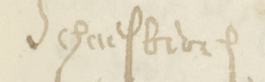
Schaesberch
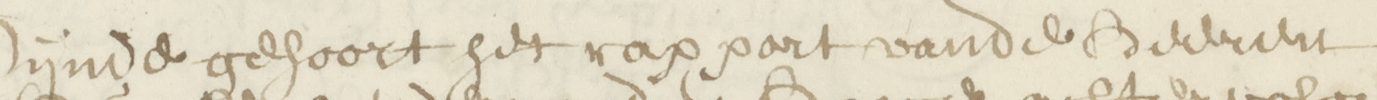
Sijnde gehoort het rapport vande Heeren
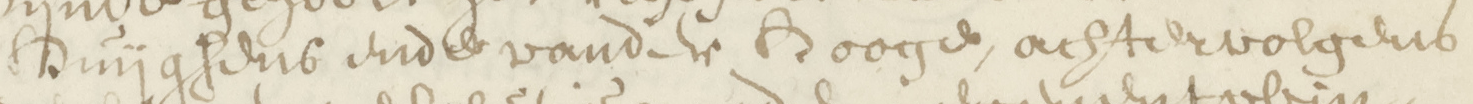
Huijghens ende vander Hooge, achtervolgens
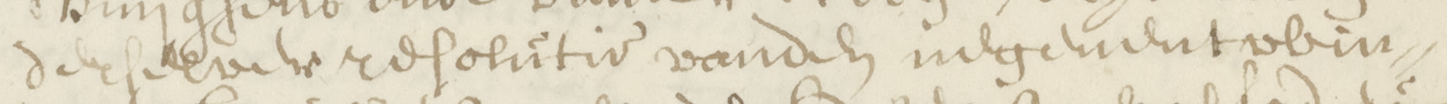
derselver resolutie vanden negenentwin„
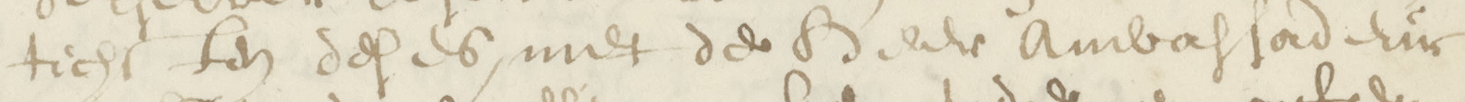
tichsten deses, met de Heer Ambassadeur
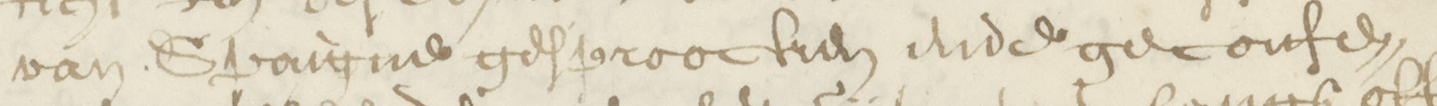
van Spaigne gesproocken ende geconfe„
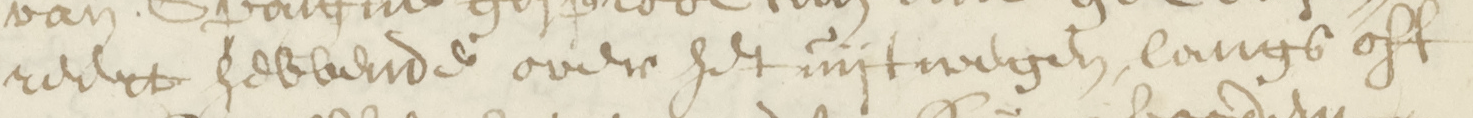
reert hebbende over het uijtwegen, langs off
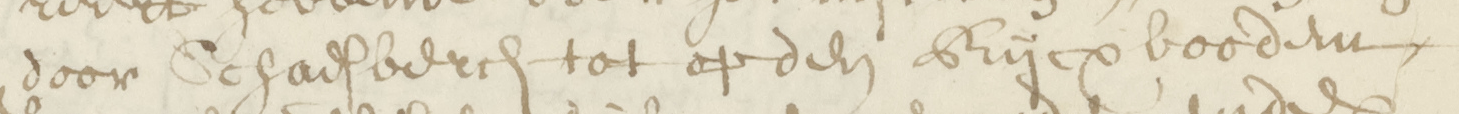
door Schaesberch tot opden Rijcx boodem.
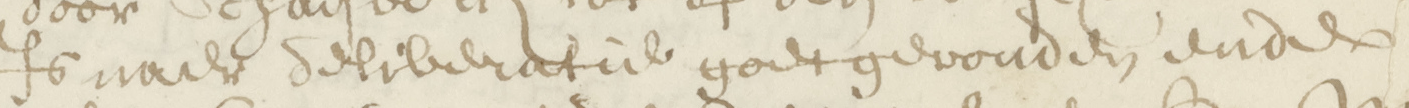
Is naer deliberatie goetgevonden ende
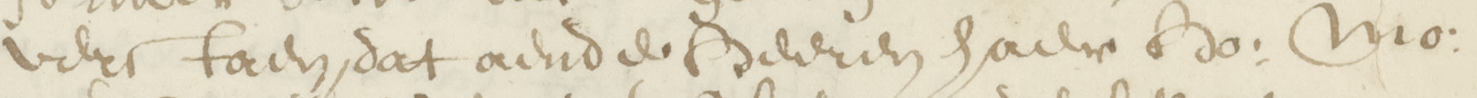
verstaen, dat aende Heeren haer Ho:Mo:
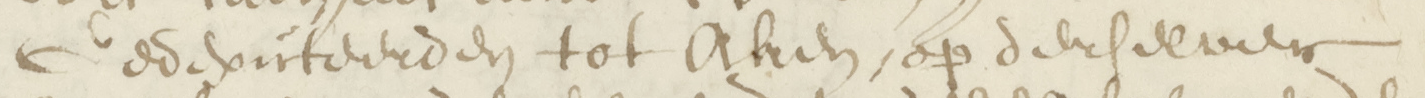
Gedeputeerden tot Aken, op derselver
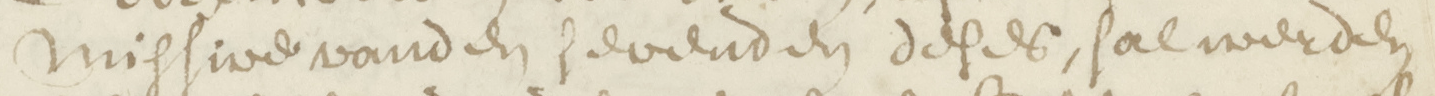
missive vanden sevenden deses, sal werden
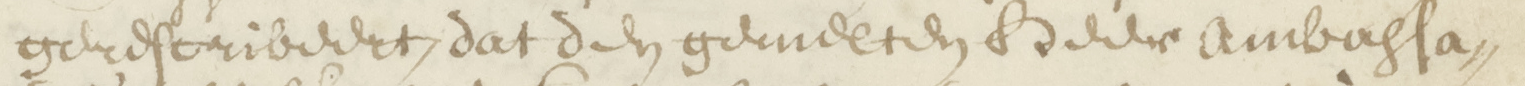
gerescribeert, dat den gemelten Heer Ambassa„
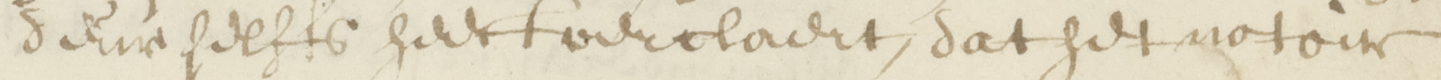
deur selffs heeft verclaert, dat het notoir
